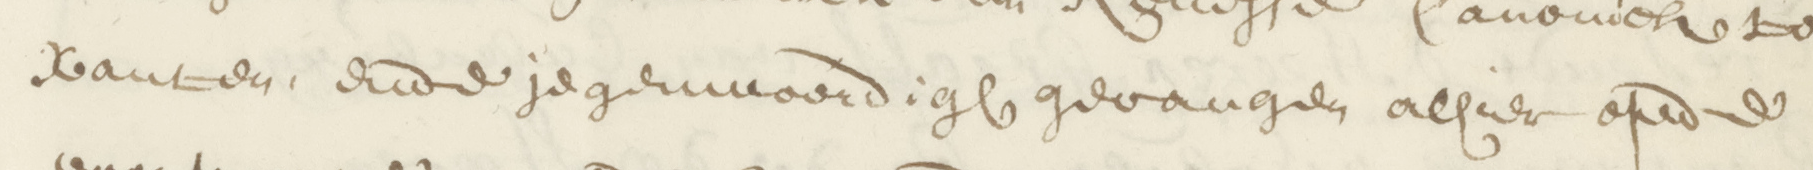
Xanten, ende jegenwoordigh gevangen alhier opde
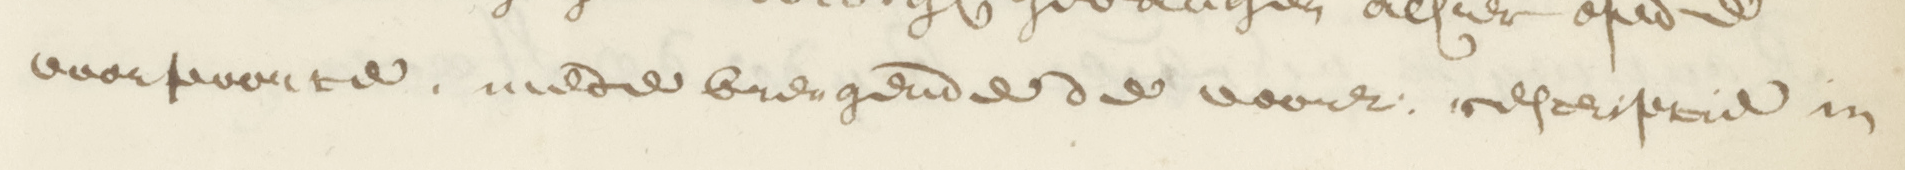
voorpoorte, mede brengende de voorz: rescriptie in
